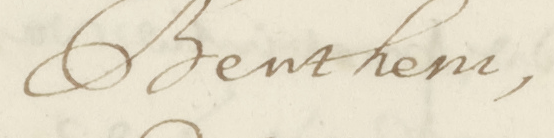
Benthem,
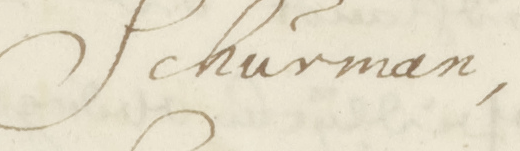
Schurman
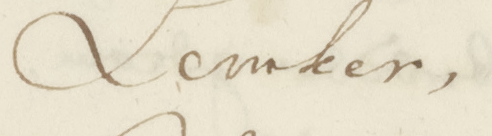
Lemker,
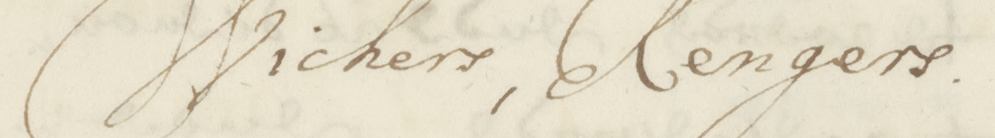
Wicher, Rengers.
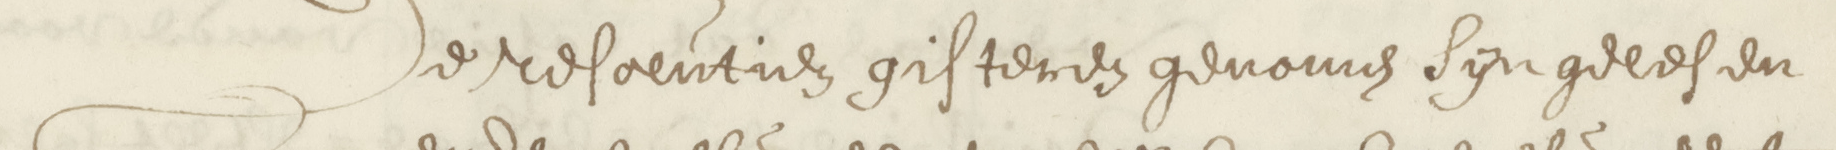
De resolutien gisteren genomen sijn gelesen
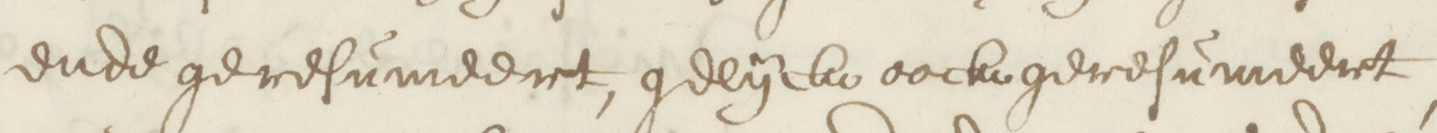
ende geresumeert, gelijck oock geresumeert
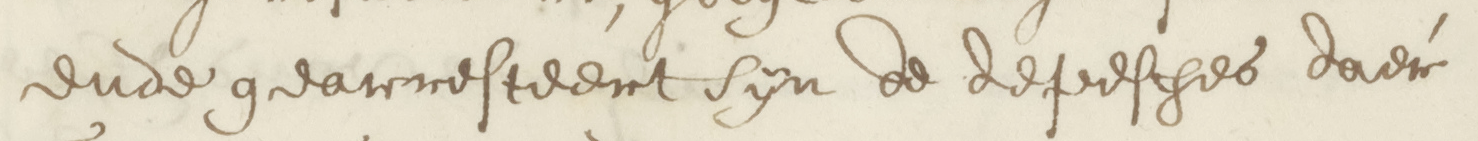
ende gearresteert sijn de depesches daer
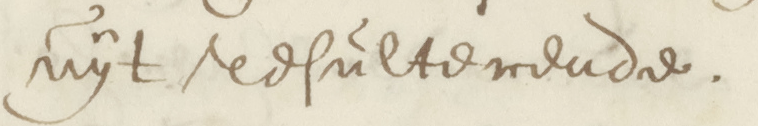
uijt resulterende.
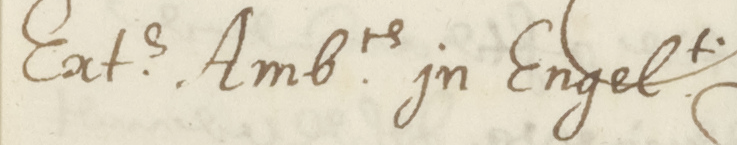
Exts. Ambr. in Engelt.
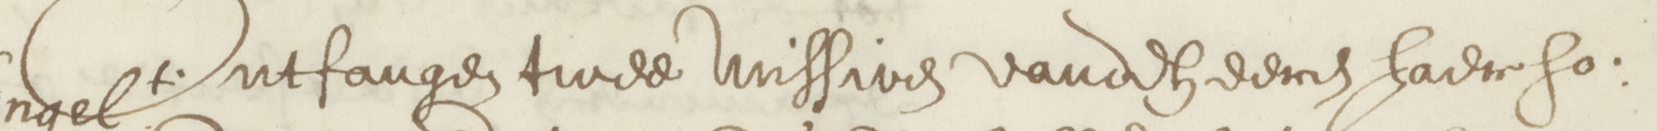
Ontfangen twee missiven vande heeren haer ho:
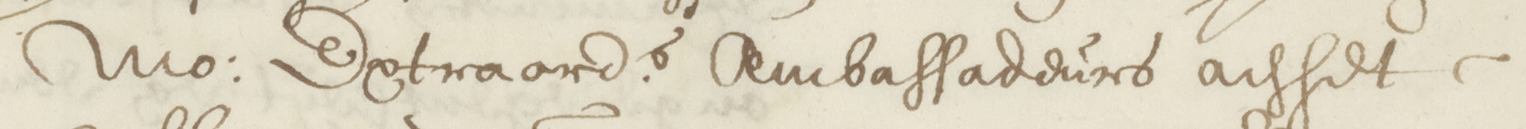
Mo: Extraords. Ambassadeurs aen het
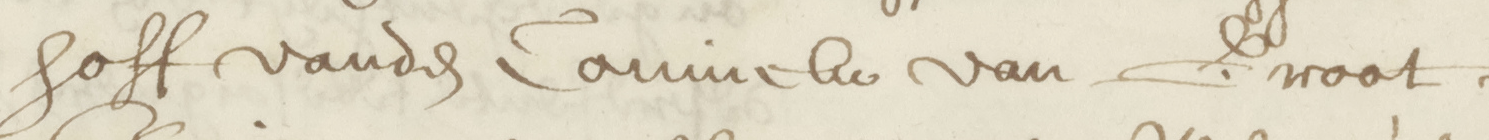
hoff vanden Coninck van Groot
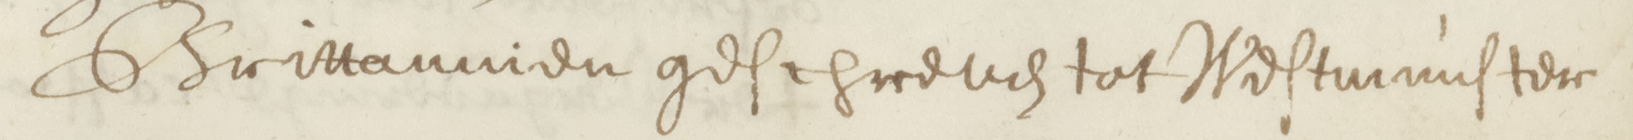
Brittannien geschreven tot Westmunster
